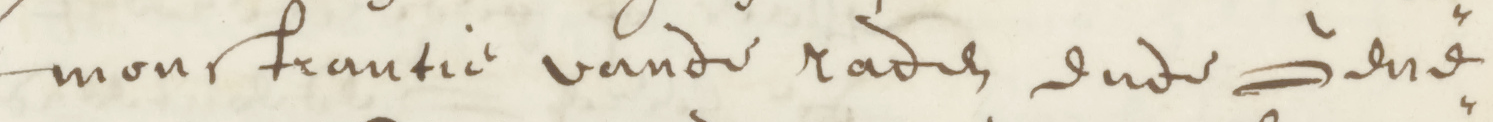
monstrantie vande raden ende Gene„
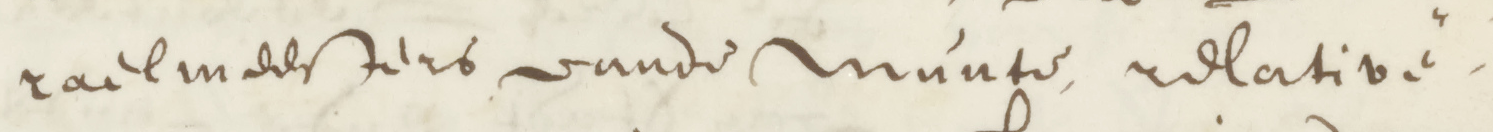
raelmeesters vande Munte, relative
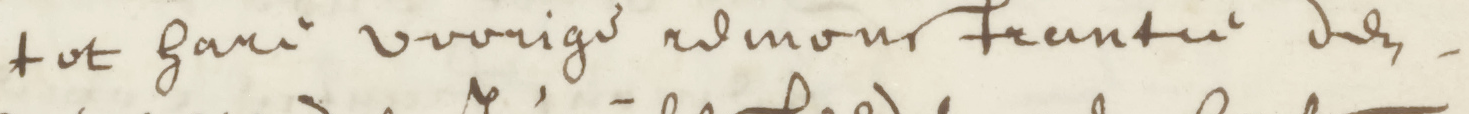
tot hare voorige remonstrantie den
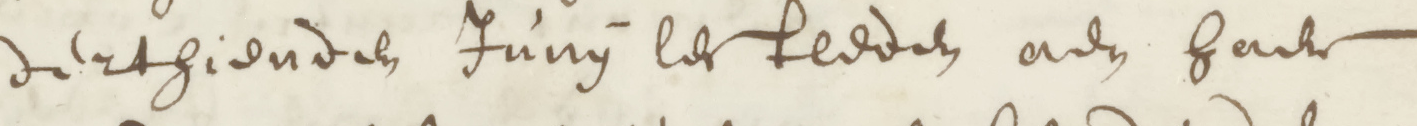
derthienden Junij lestleden aen haer
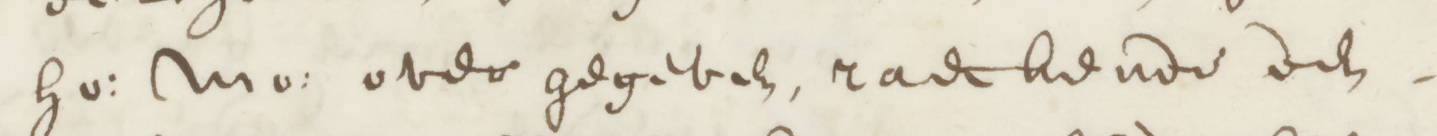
ho:Mo: over gegeven, raeckende den
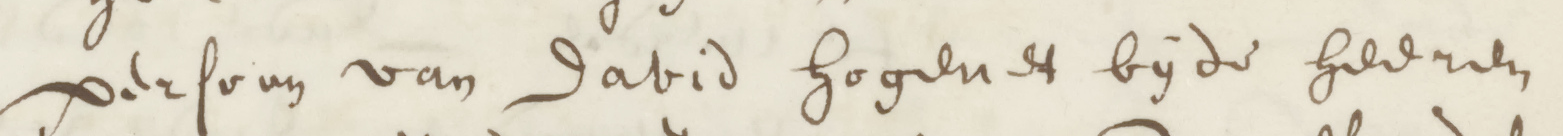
persoon van David hogenet bijde heeren
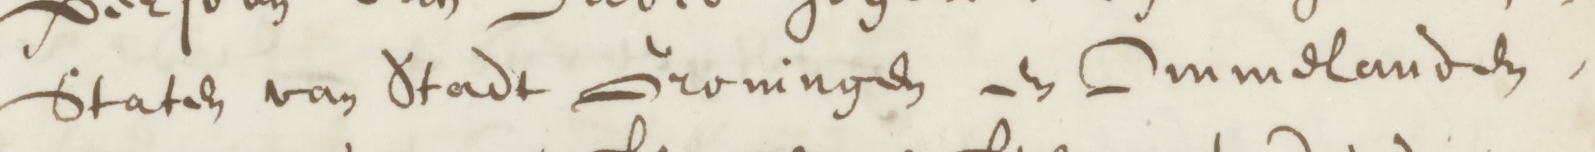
Staten van Stadt Groningen en Ommelanden
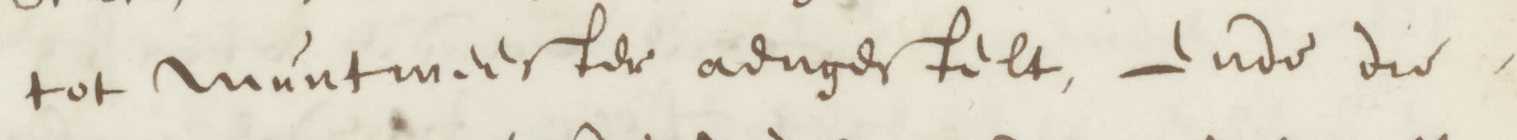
tot Muntmeester aengestelt, ende die
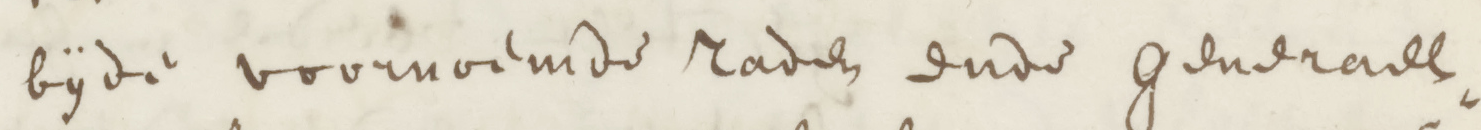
bijde voornoemde raden ende generael„
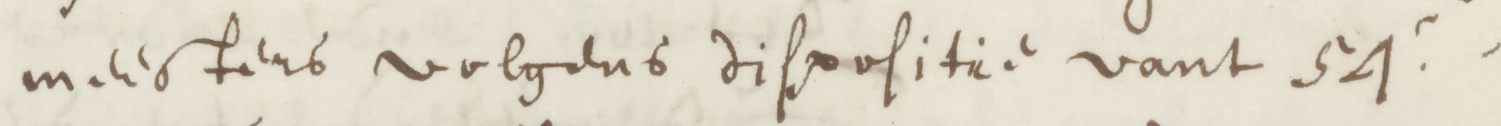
meesters volgens dispositie vant 54e.
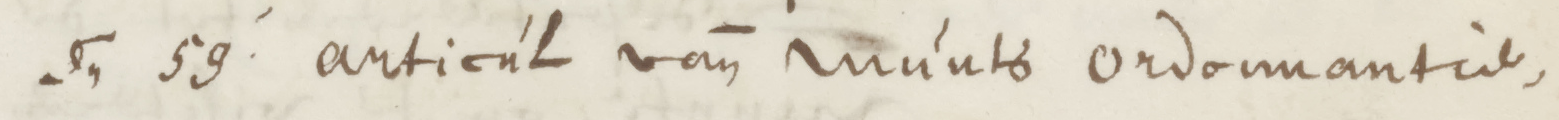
en 59e. articul van Munts ordonnantie,
